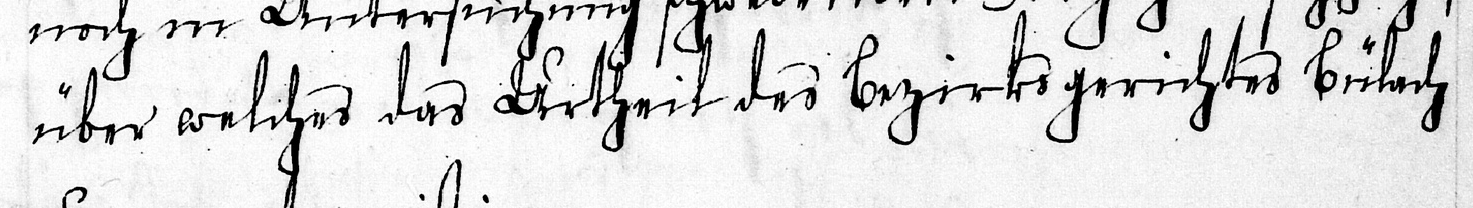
über welches das Urtheil des Bezirksgerichtes Bülach
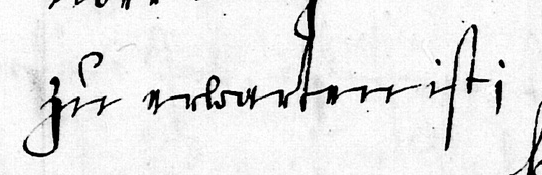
zu erwarten ist;
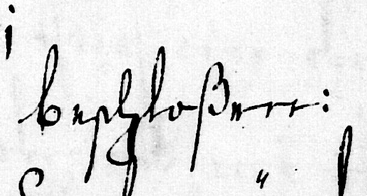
beschloßen:
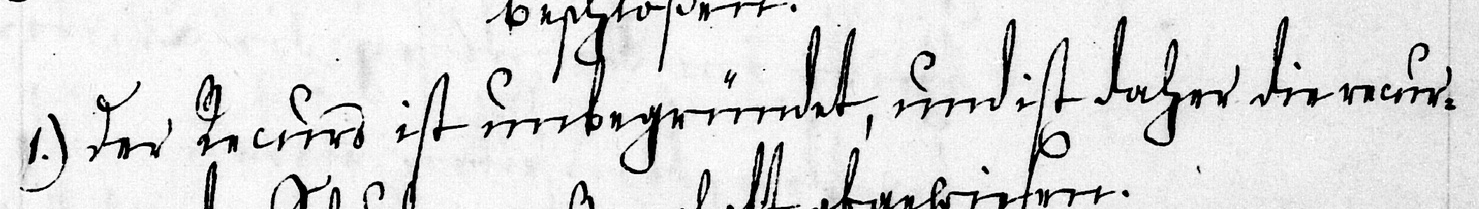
1.) Der Recurs ist unbegründet, und ist daher die recur¬
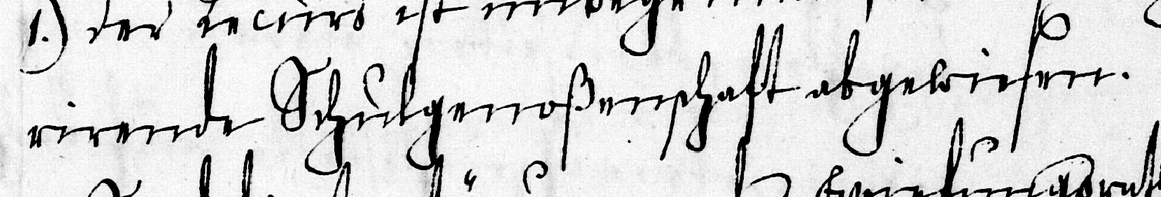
rirende Schulgenoßenschaft abgewiesen.
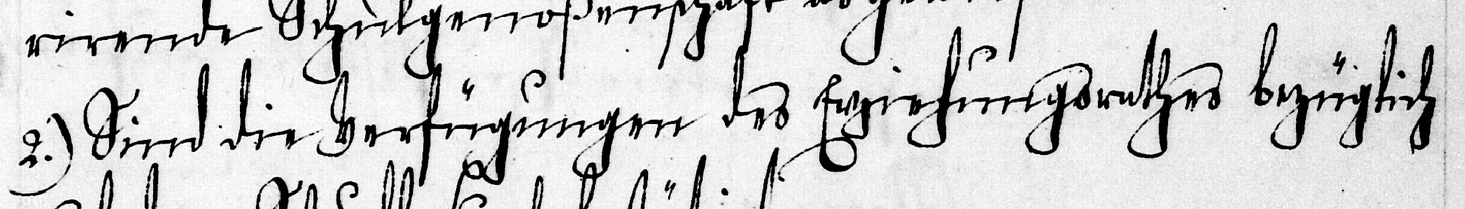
2.) Sind die Verfügungen des Erziehungsrathes bezüglich
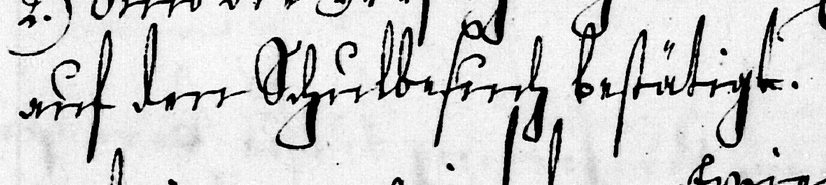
auf den Schulbesuch bestätigt.
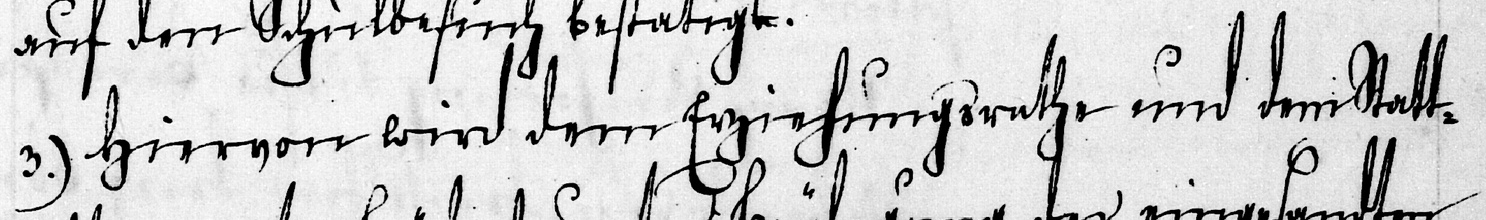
3.) Hiervon wird dem Erziehungsrathe und dem Stat¬
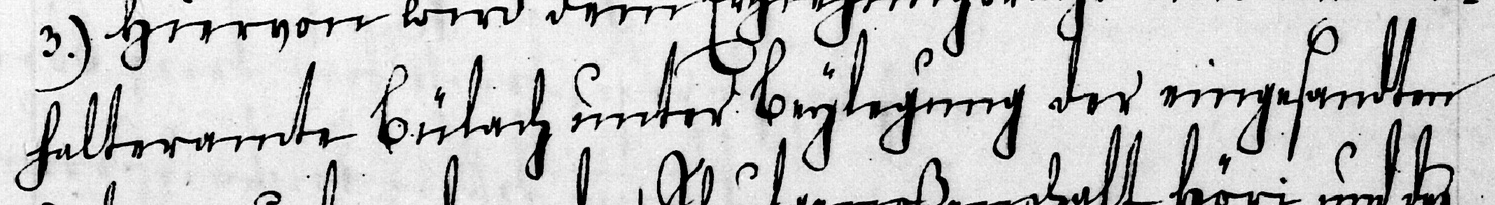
thalteramte Bülach unter Beylegung der eingesandten
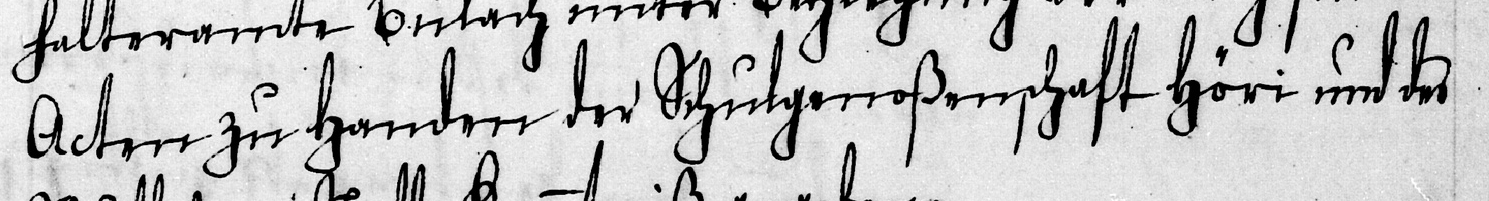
Acten zu Handen der Schulgenoßenschaft Höri und des
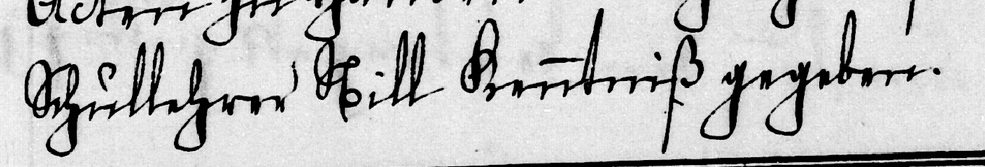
Schullehrer Nill Kenntniß gegeben.
